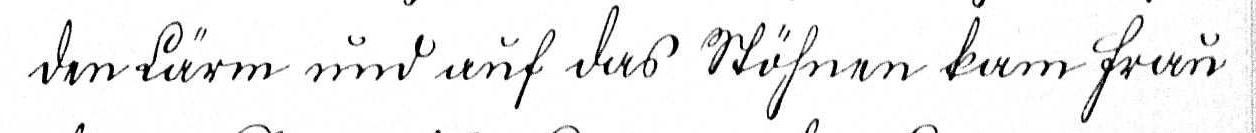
den Lärm und auf das Stöhnen kam Frau
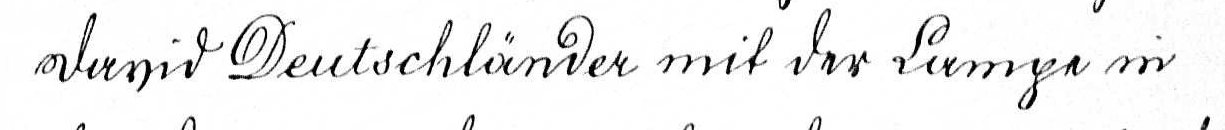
David Deutschländer mit der Lampe in
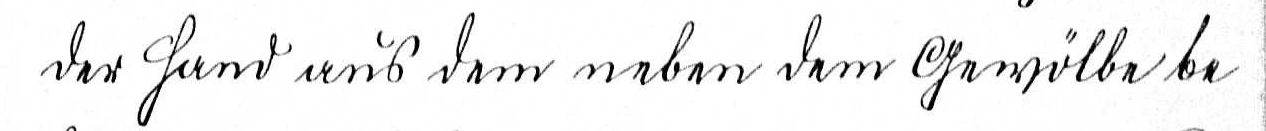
der Hand aus dem neben dem Gewölbe be¬
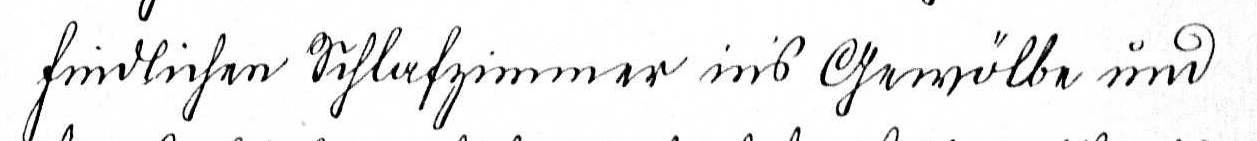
findlichen Schlafzimmer ins Gewölbe und
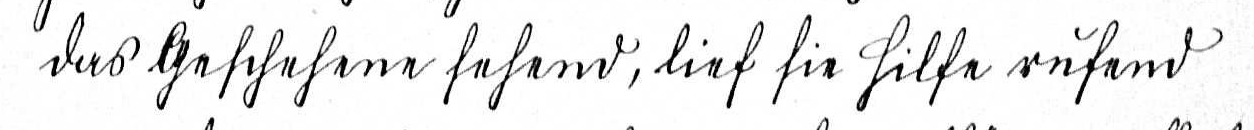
das Geschehen sehend, lief sie Hilfe rufend
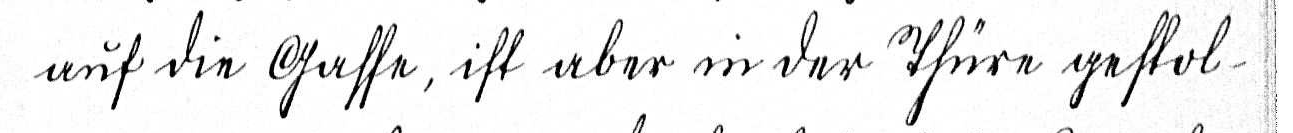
auf die Gasse, ist aber in der Thüre gestol¬
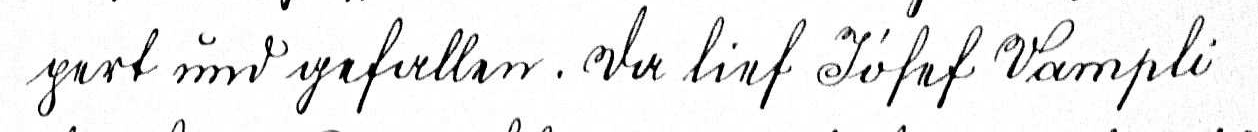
pert und gefallen. Da lief Jósef Vampli
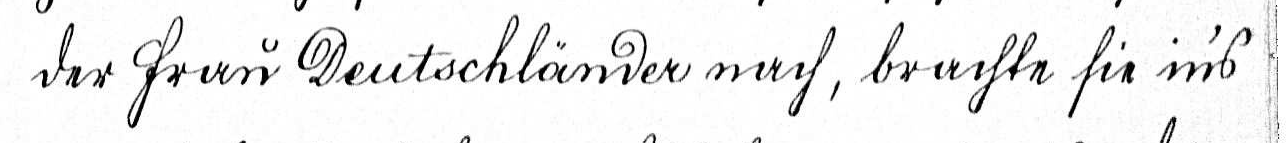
der Frau Deutschländer nach, brachte sie ins
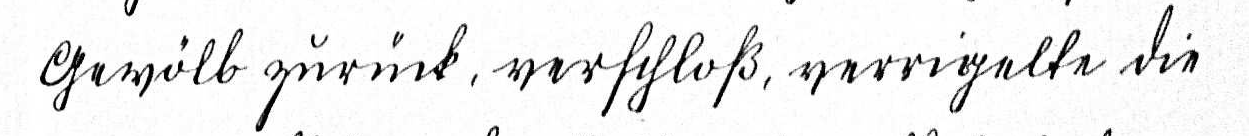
Gewölb zurück, verschloß, verrigelte die
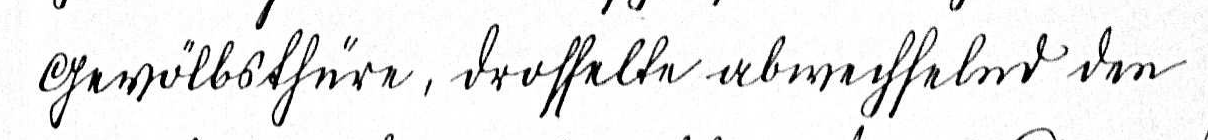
Gewölbsthüre, drosselte abwechselnd den
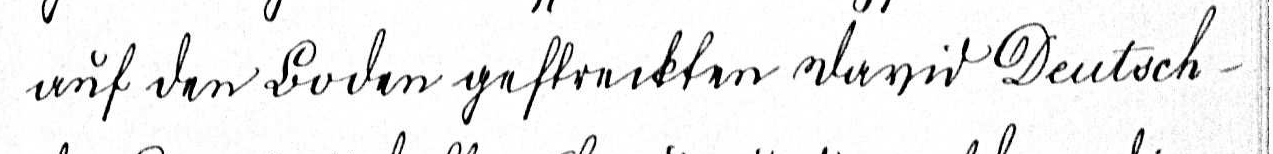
auf den Boden gestreckten David Deutsch¬
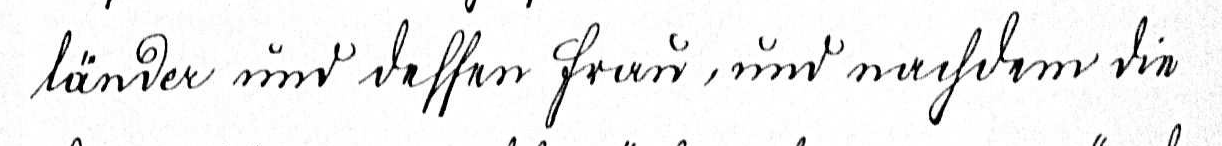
länder und dessen Frau, und nachdem die
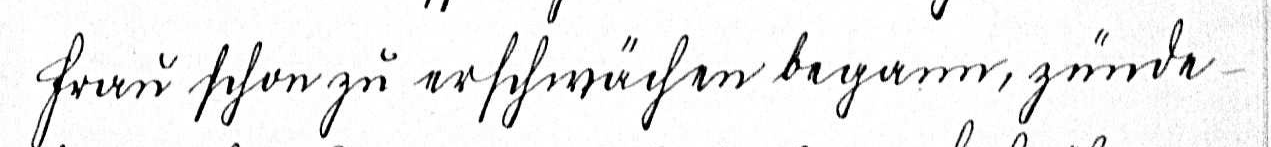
Frau schon zu erschwächen begann, zünde¬
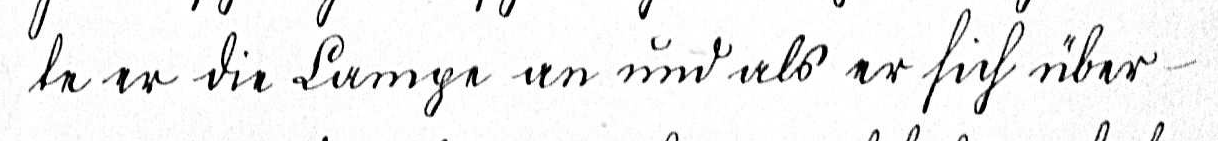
te er die Lampe an und als er sich über¬
